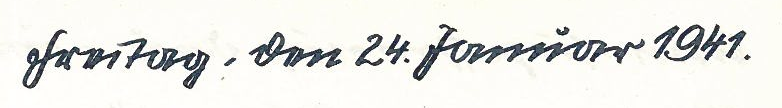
Freitag, den 24. Januar 1941.
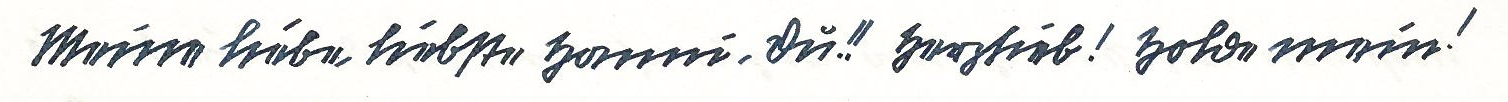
Meine liebe, liebste, Du!! Herzlieb! Holde mein!
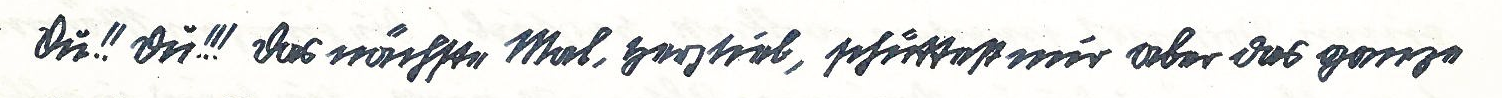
Du!! Du!!! Das nächste Mal, Herzlieb, schüttest mir aber das ganze
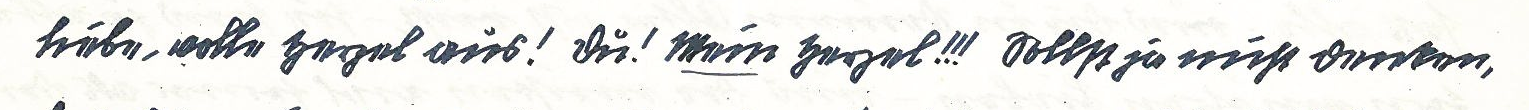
liebe, volle Herzel aus! Du! Mein Herzel!!! Sollst ja nicht denken,
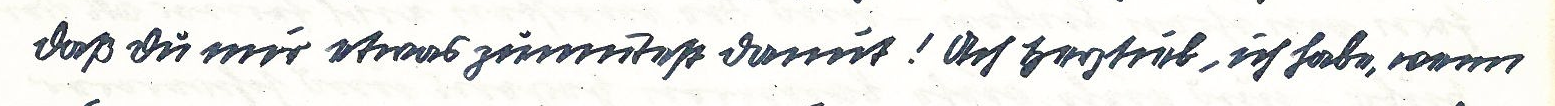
dass Du mir etwas zumutest damit! Ach Herzlieb, ich habe, wenn
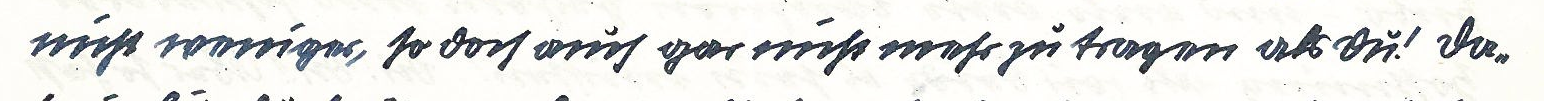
nicht weniger, so doch auch gar nicht mehr zu tragen als Du!
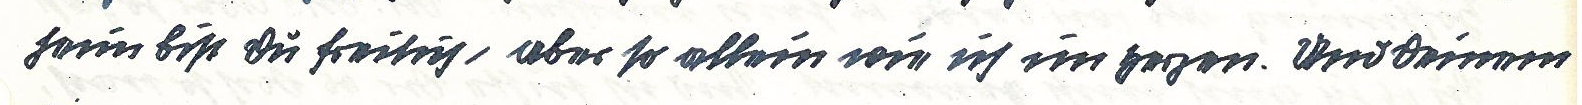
Daheim bist Du freilich, aber so allein wie ich im Herzen. Und Deinem
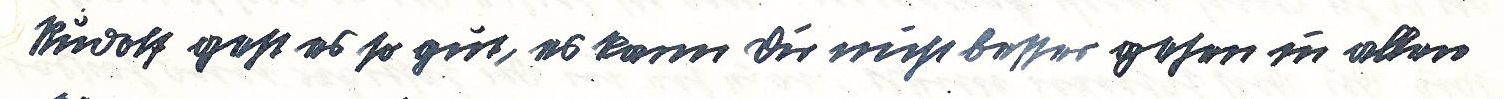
Rudolf geht es so gut, es kann Dir nicht besser gehen in allen
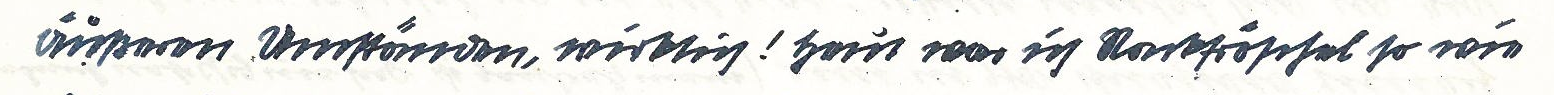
äußeren Umständen, wirklich! Heut war ich Nacktfröschel so wie
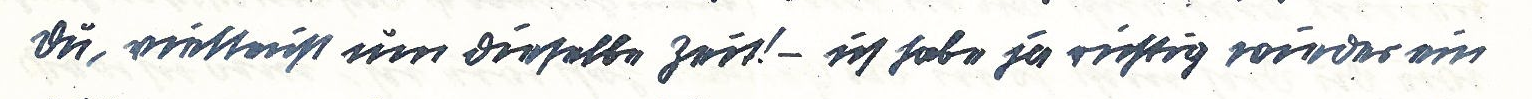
Du, vielleicht um dieselbe Zeit! – ich habe ja richtig wieder ein
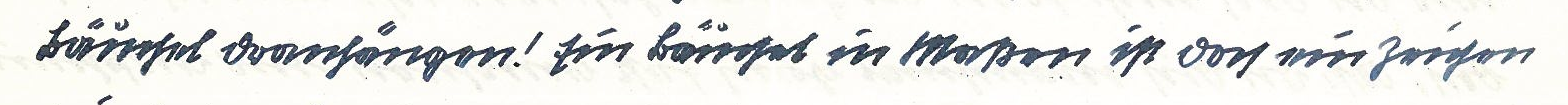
Bäuchel dranhängen! Ein Bäuchel in Maßen ist doch ein Zeichen
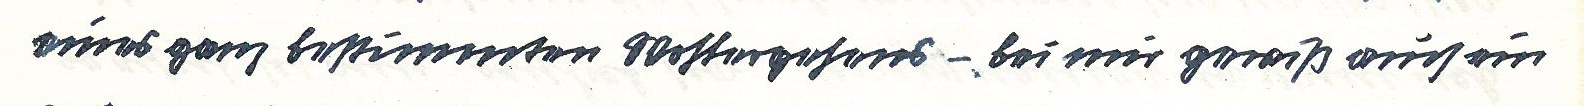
eines ganz bestimmten Wohlergehens – bei mir gewiß auch ein
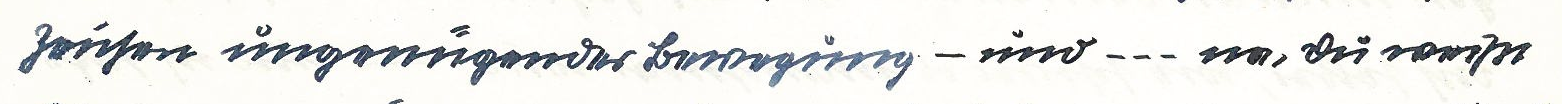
Zeichen ungenügender Bewegung – und – – – na, Du weißt
